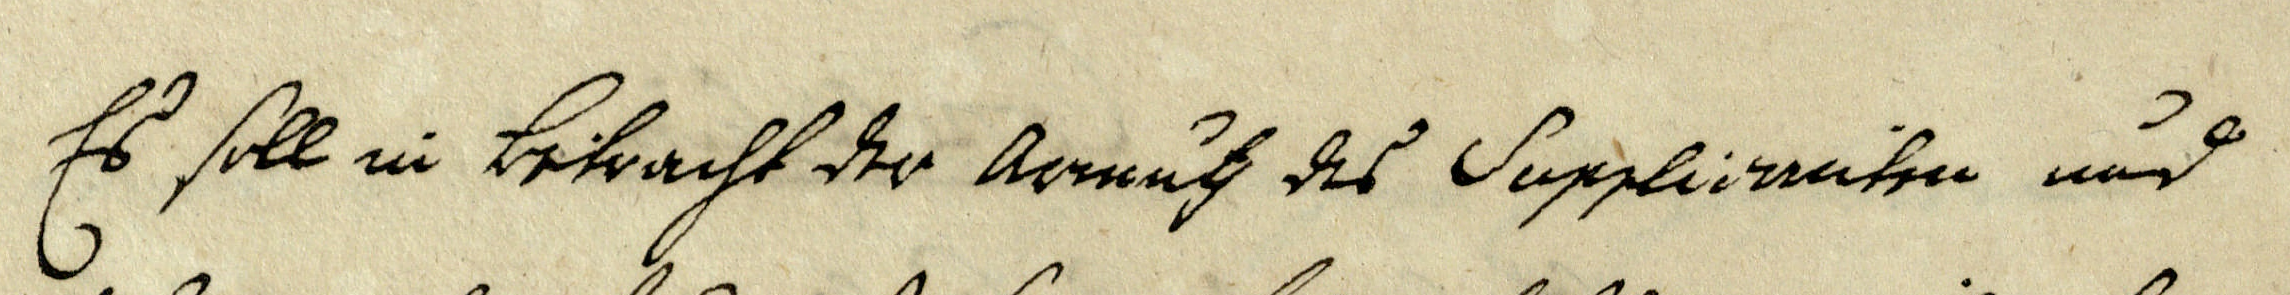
Es soll in Betracht der Armuth des Supplicanten und
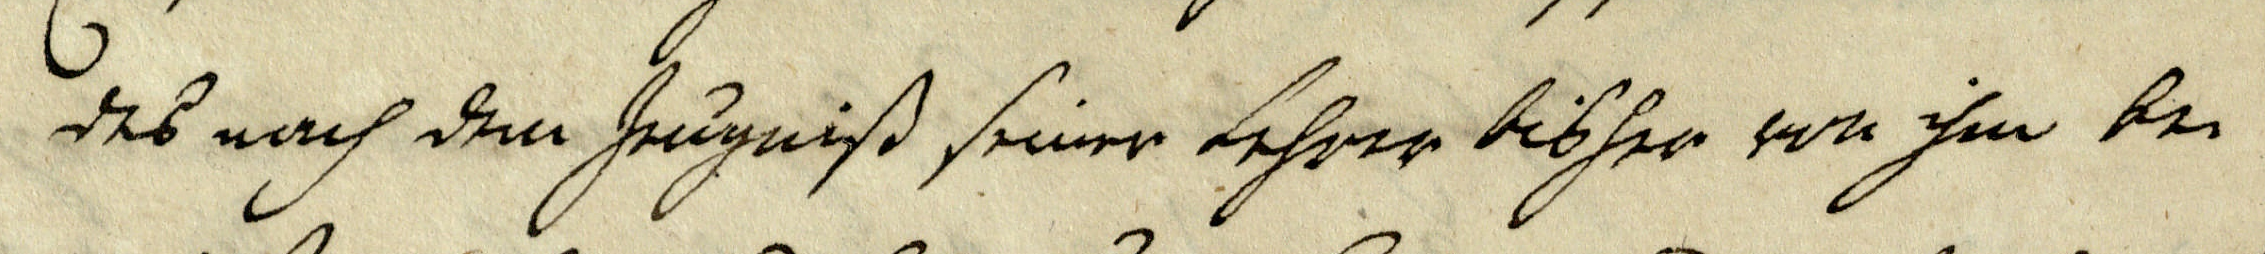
des nach dem Zeugniß seiner Lehrer bisher von ihm be¬
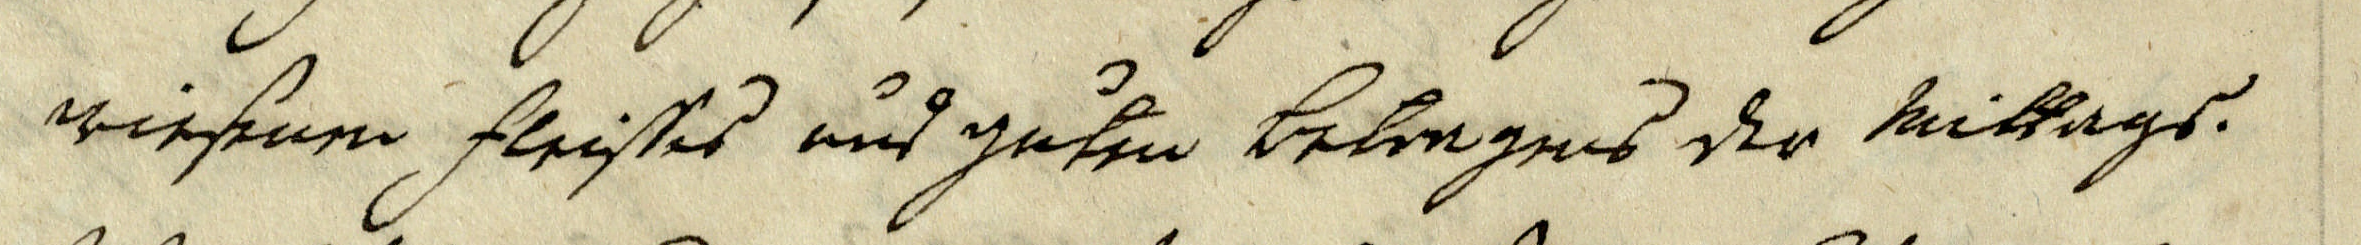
wiesenen Fleisses und guten Betragens der Mittags¬
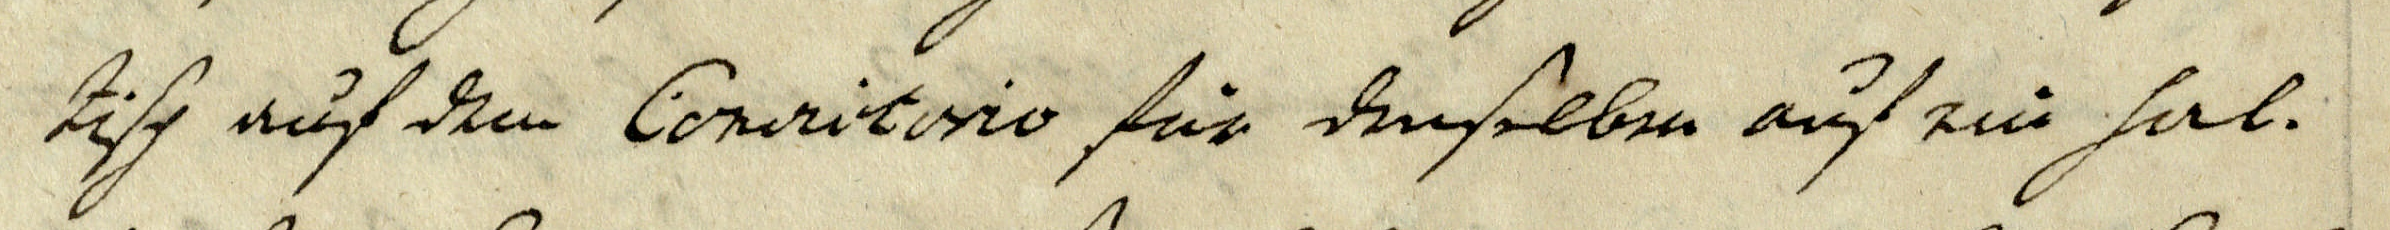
Tisch auf dem Convictorio für denselben auf ein hal¬
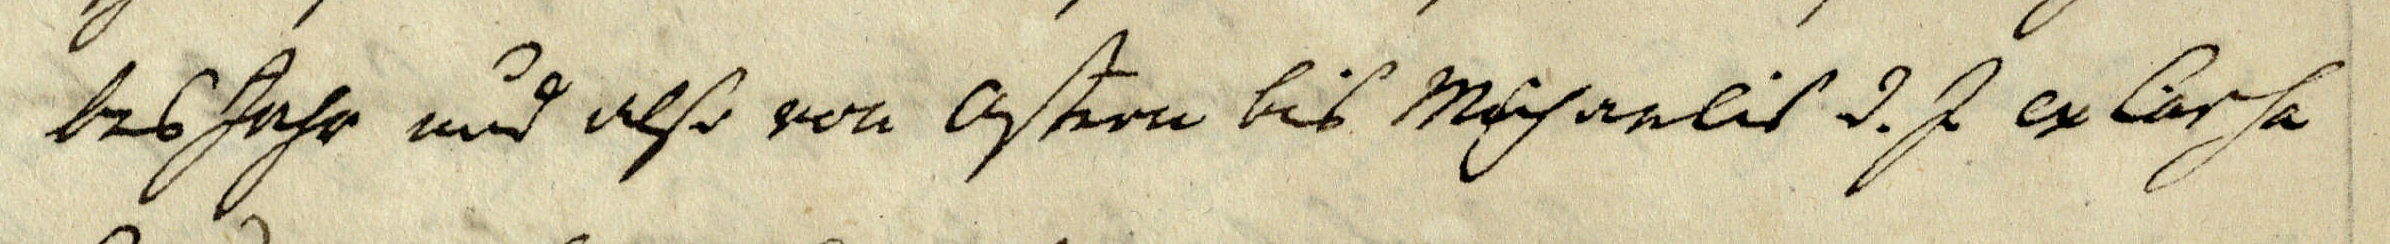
bes Jahr und also von Ostern bis Michaelis d. J. ex Cassa
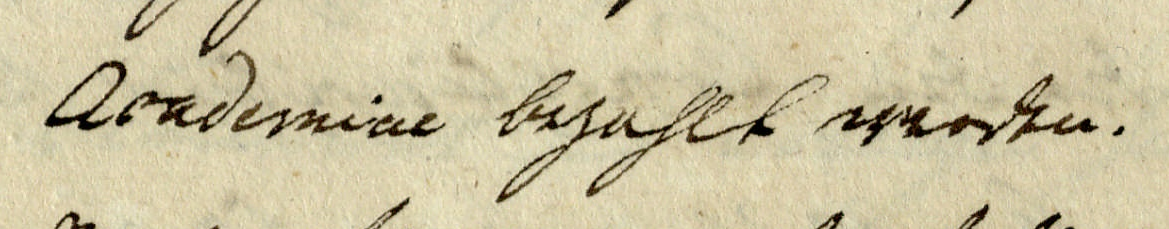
Academiae bezahlt werden.
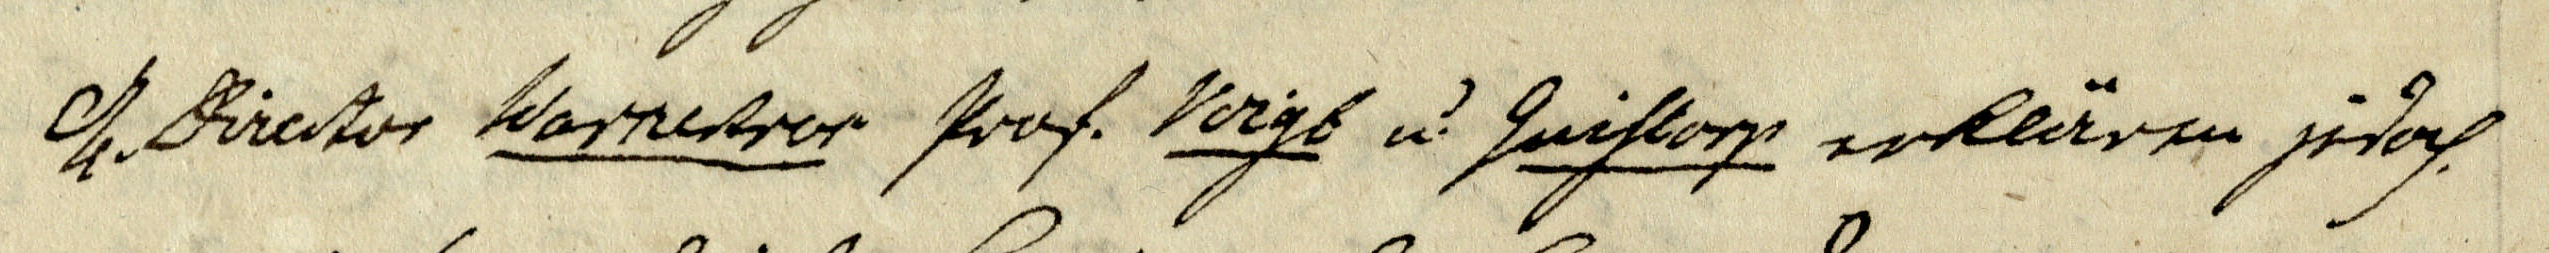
dh. Director Warnekros Prof. Voigt u Quistorp erklären jedoch,
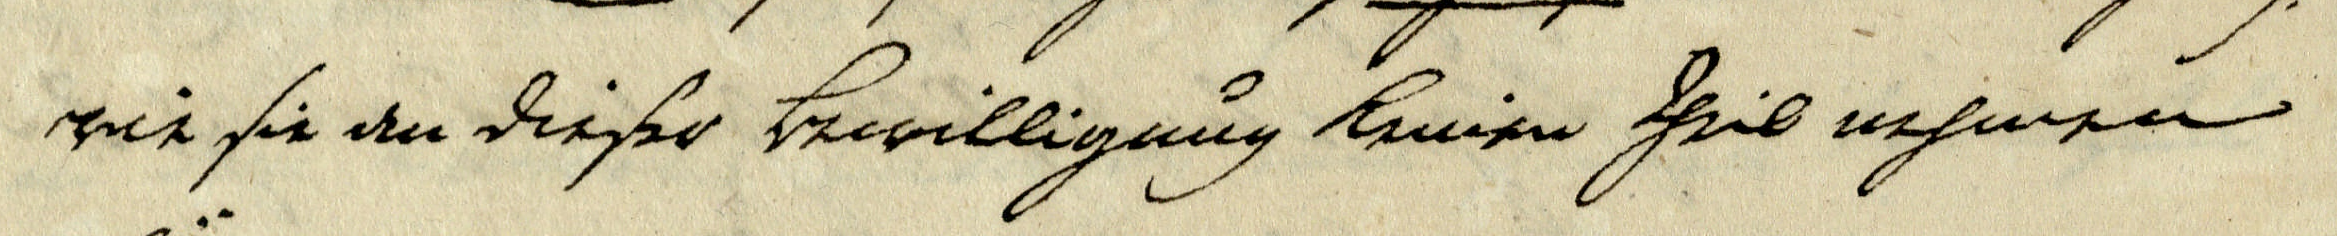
wie sie an dieser Bewilligung keinen Theil nehmen
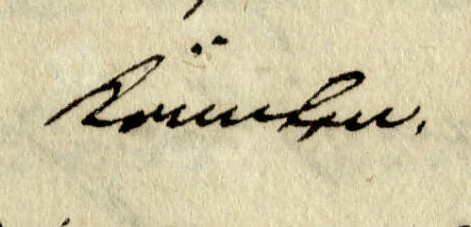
könnten
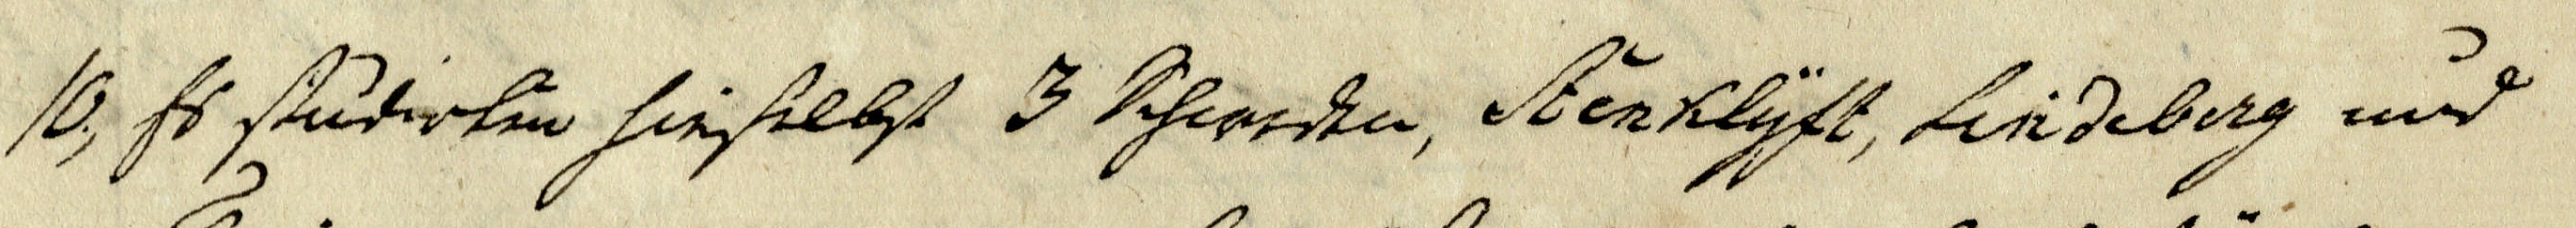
10, Es studirten hieselbst 3 Schweden, Stenklÿft, Lindeberg und
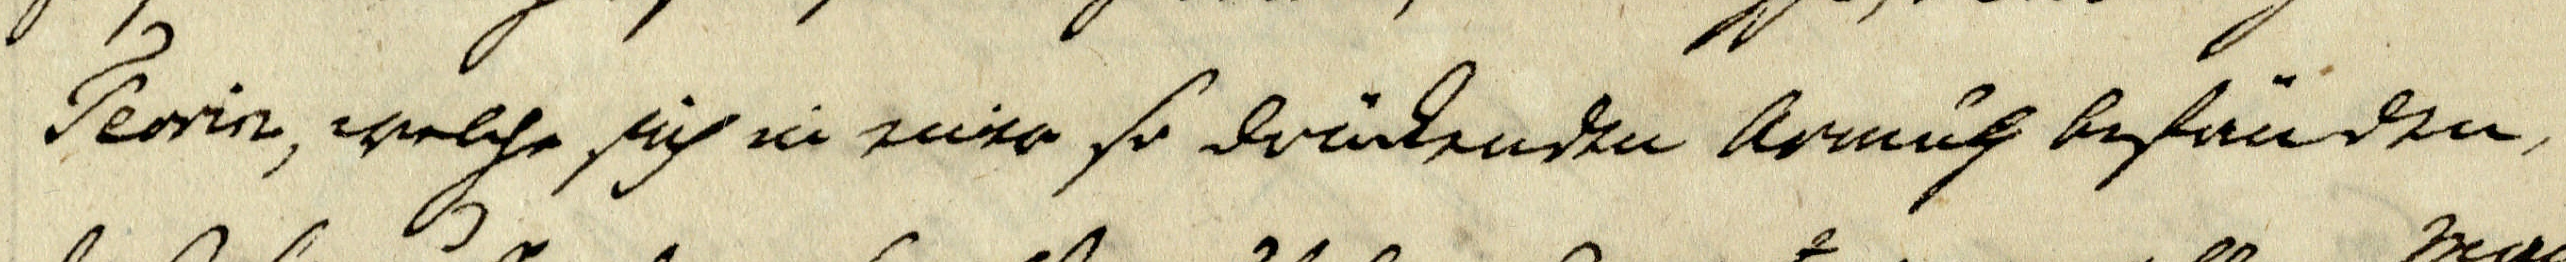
Terrin, welche sich in einer so drückenden Armuth befänden,
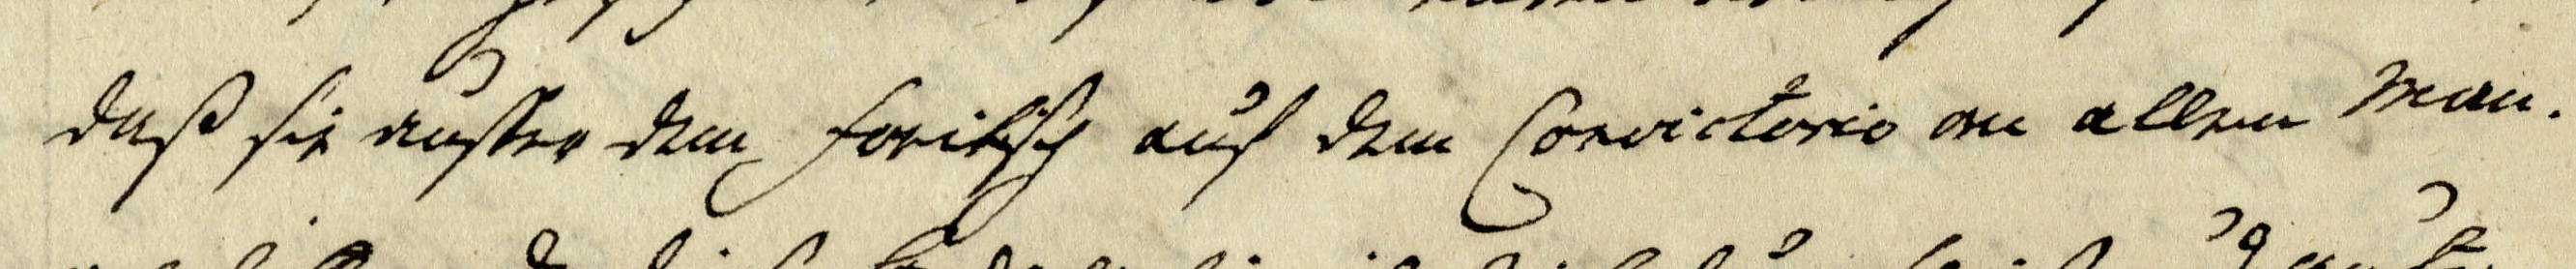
daß sie ausser dem Freitisch auf dem Convictorio an allem Man¬
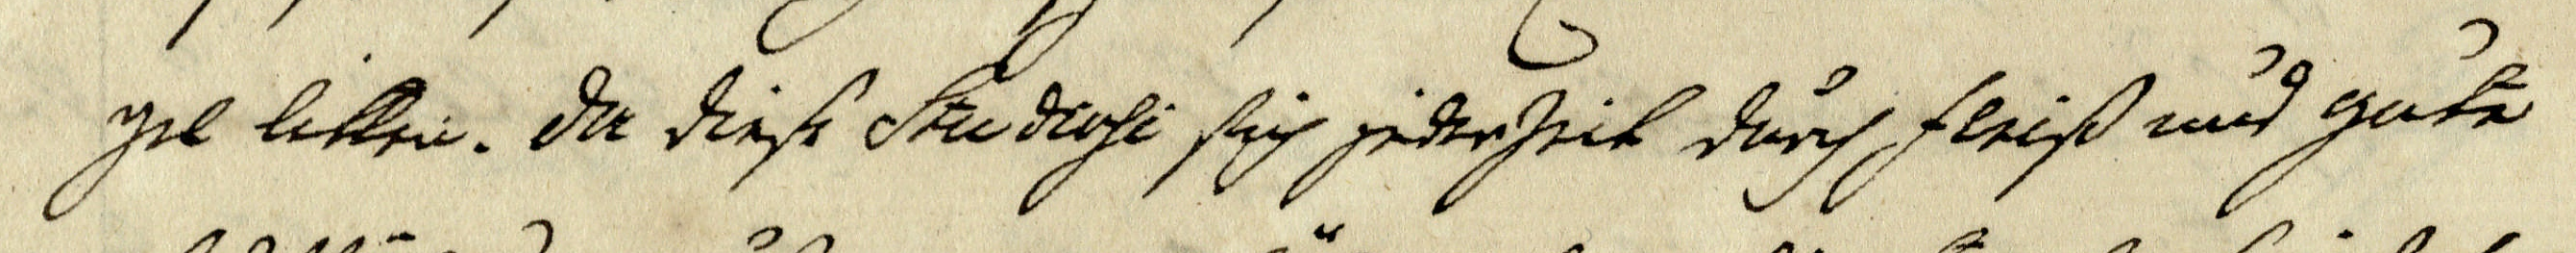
gel litten. Da diese Studiosi sich jederzeit durch Fleiß und gute
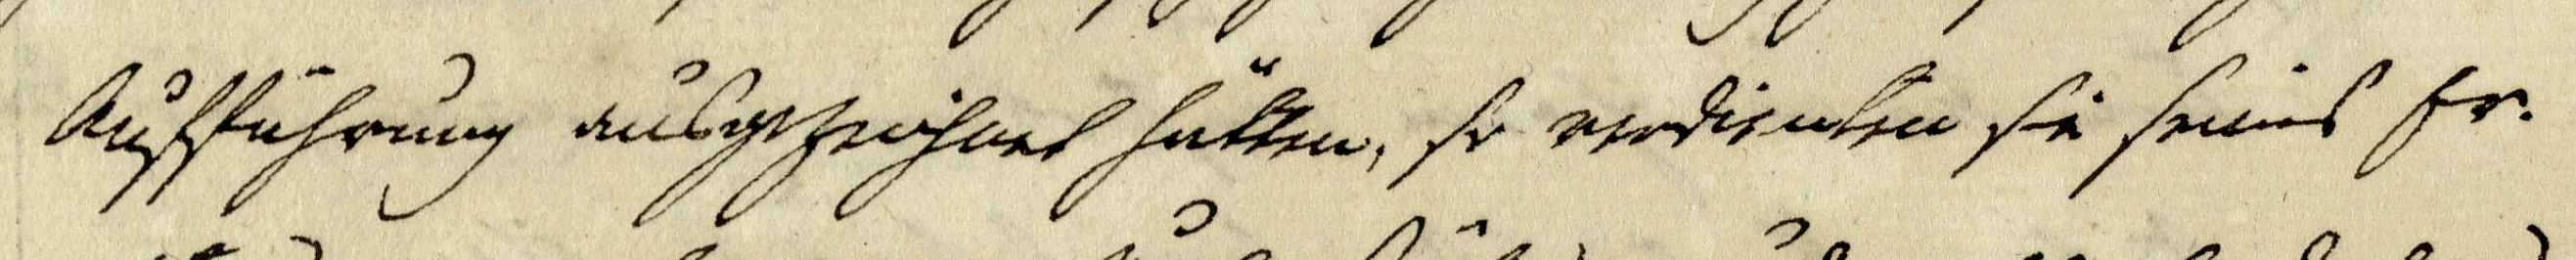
Aufführung ausgezeichnet hätten, so verdienten sie seines Er¬
